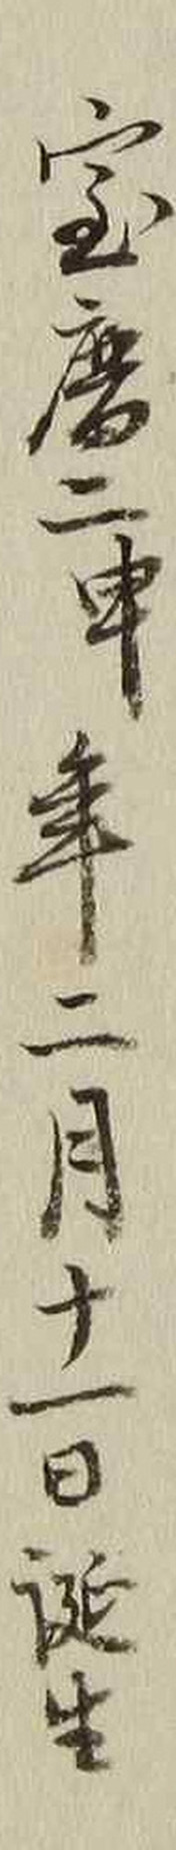宝暦二申年二月十一日誕生
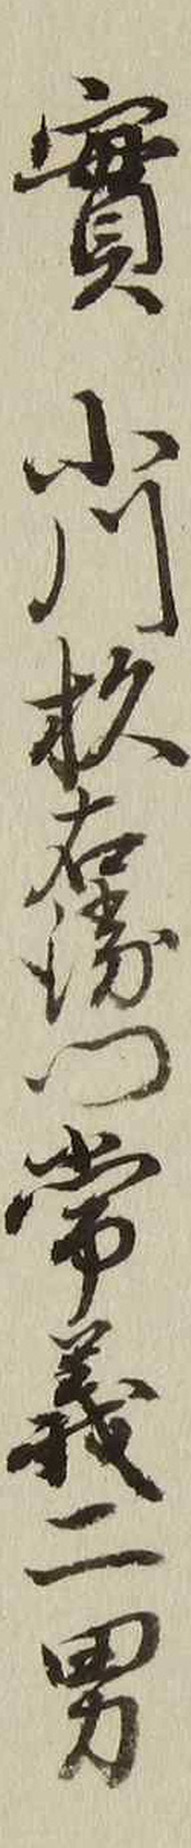実小川杉右衛門常義二男
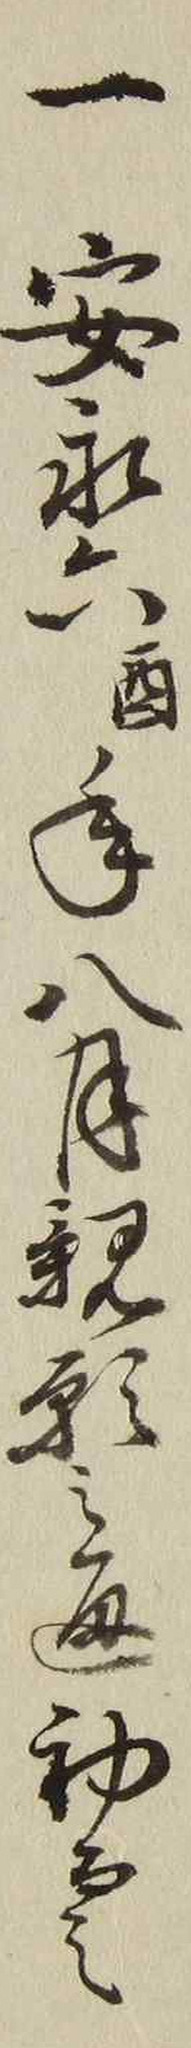一安永六酉年八月親願之通初而之
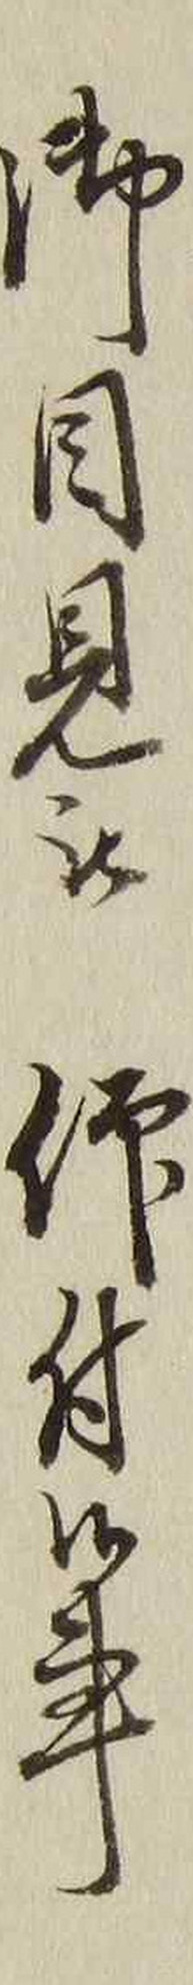御目見被仰付候事
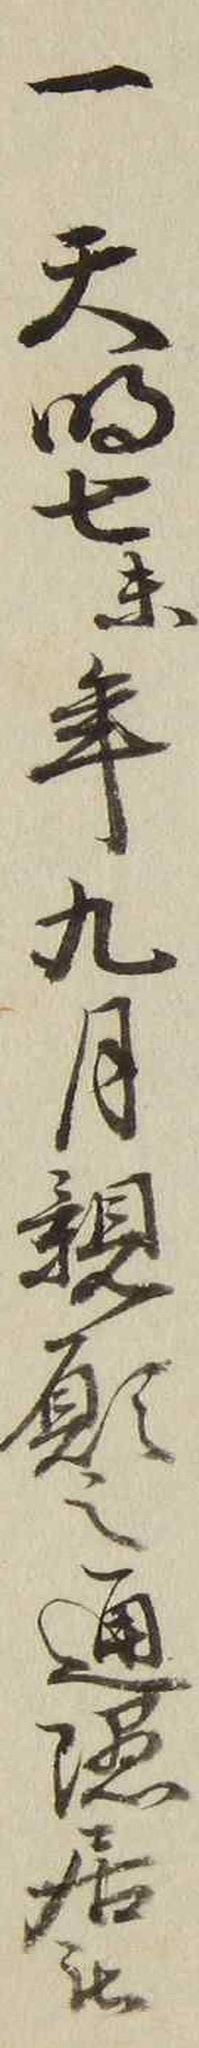一天明七未年九月親願之通隠居被

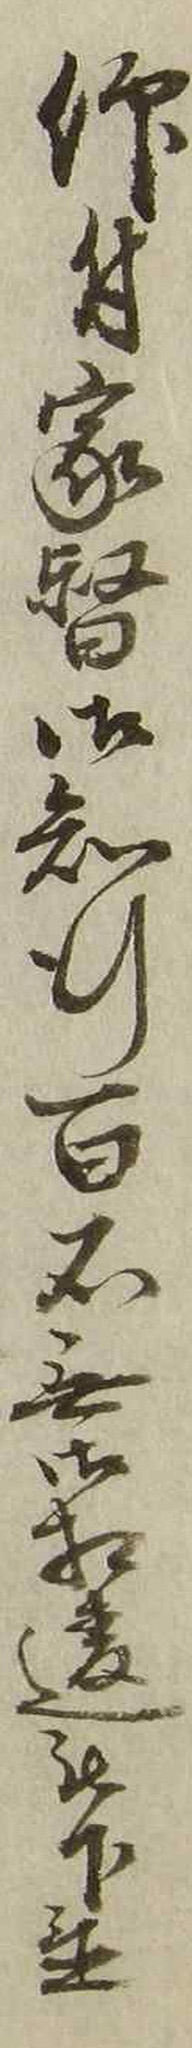仰付家督御知行百石無御相違被下置
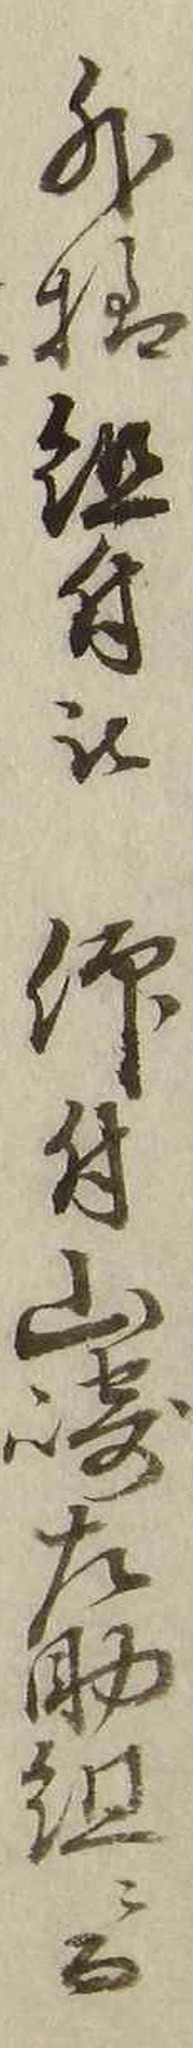外様組付被仰付山崎左助組ニ而
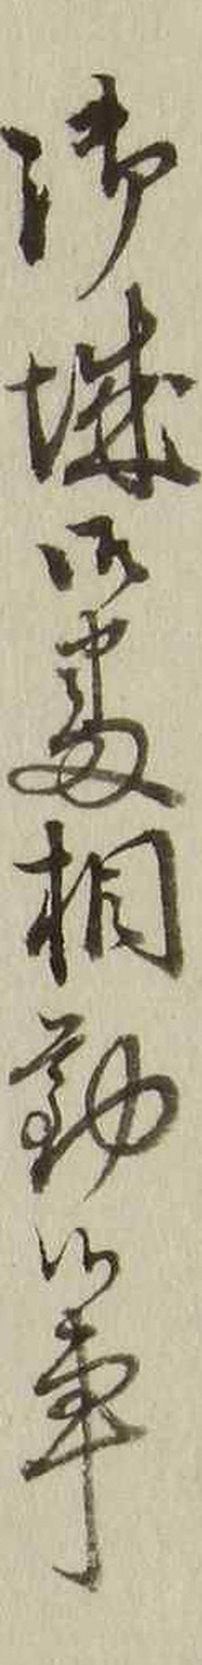御城御番相勤候事
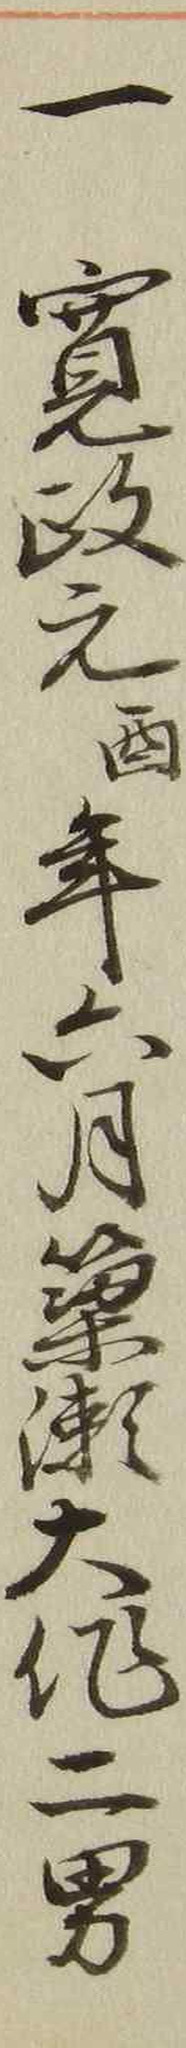一寛政元酉年六月簗瀬大作二男
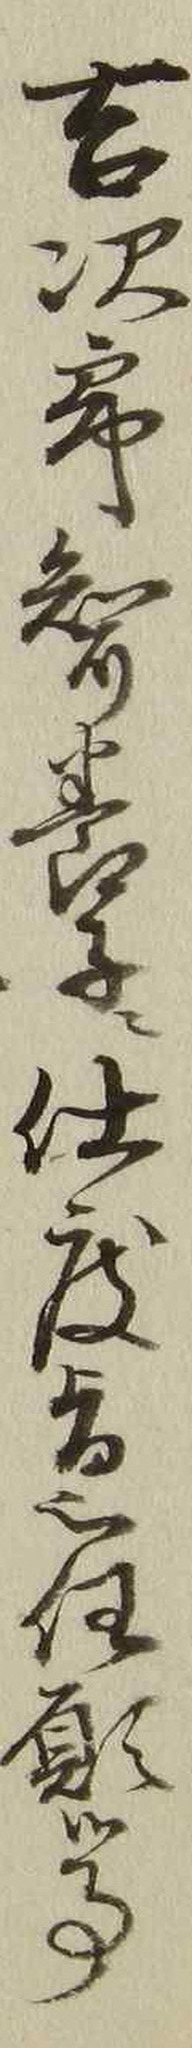吉次郎聟養子ニ仕度旨被任願候事
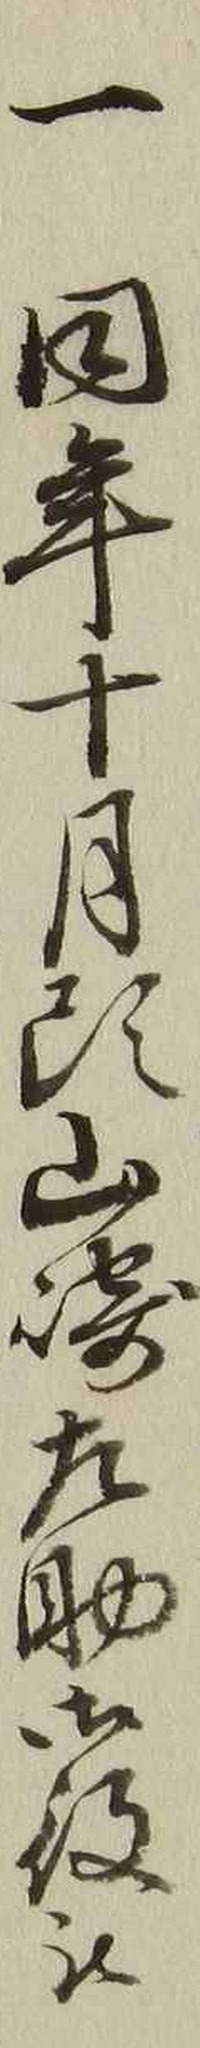一同年十月頭山崎左助御役被
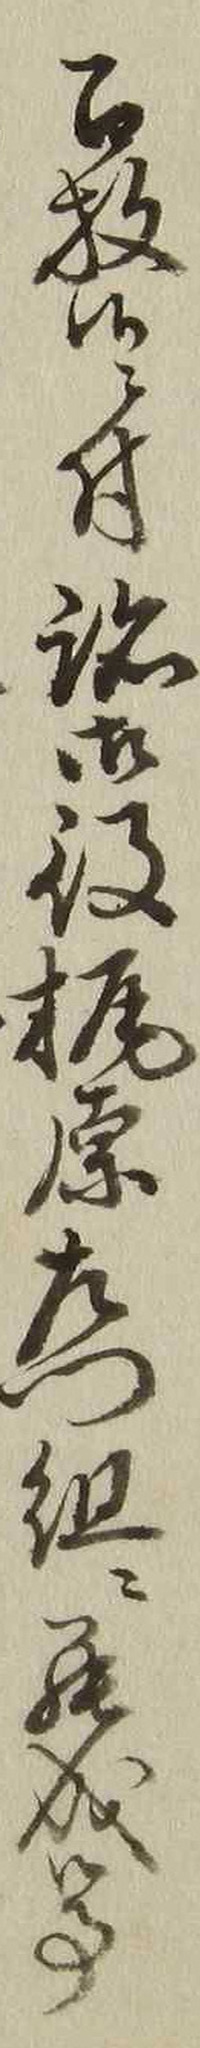召放候ニ付跡御役梶原左門組ニ罷成候事
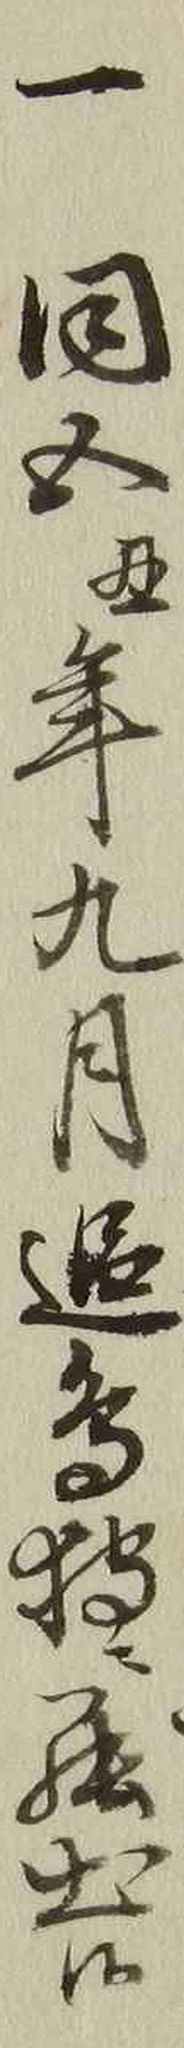一同五丑年九月追鳥狩ニ罷出候
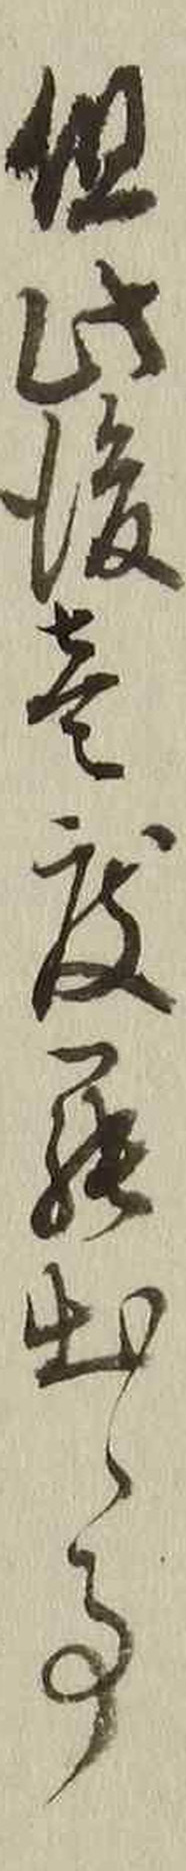但此後壱度罷出候事
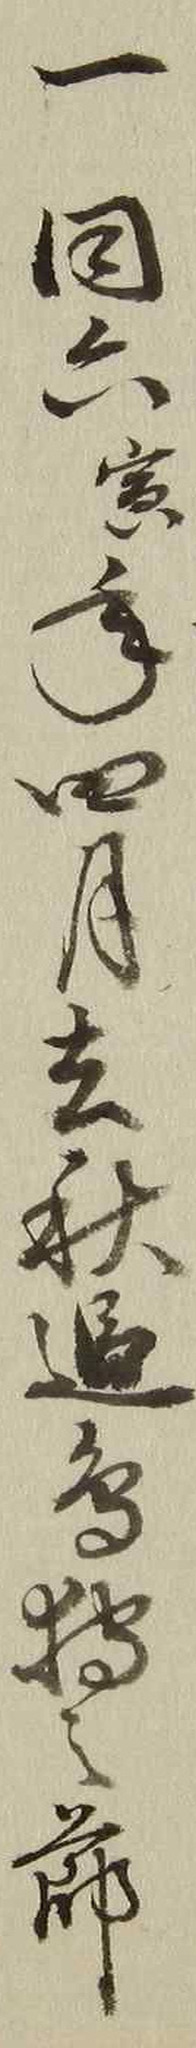一同六寅年四月去秋追鳥狩之節
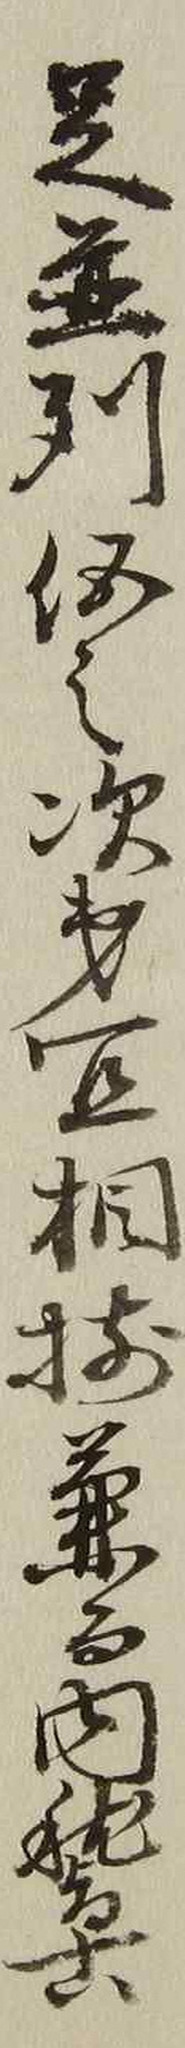足並列伍之次第宜相揃兼而内稽古
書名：諸士系譜　巻之27　い之部27
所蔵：会津若松市立会津図書館
